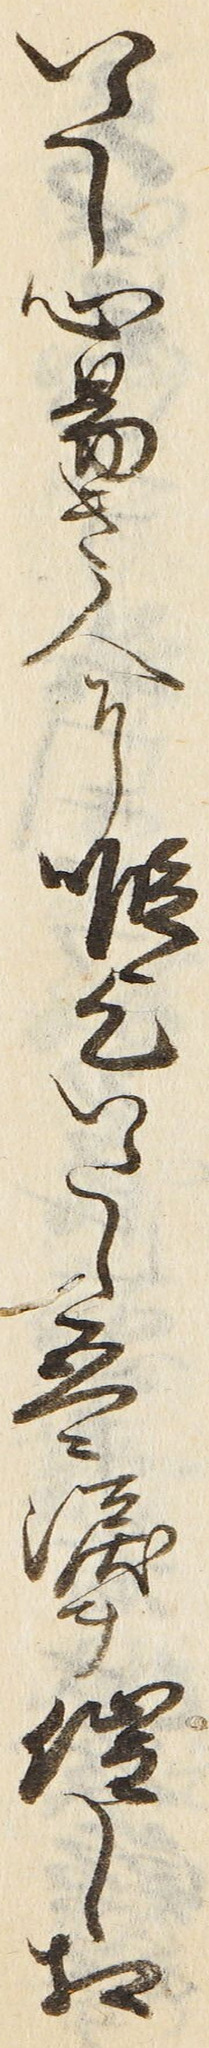いたし心易き人に暇乞いいたし互ニ涙ヲ催し相
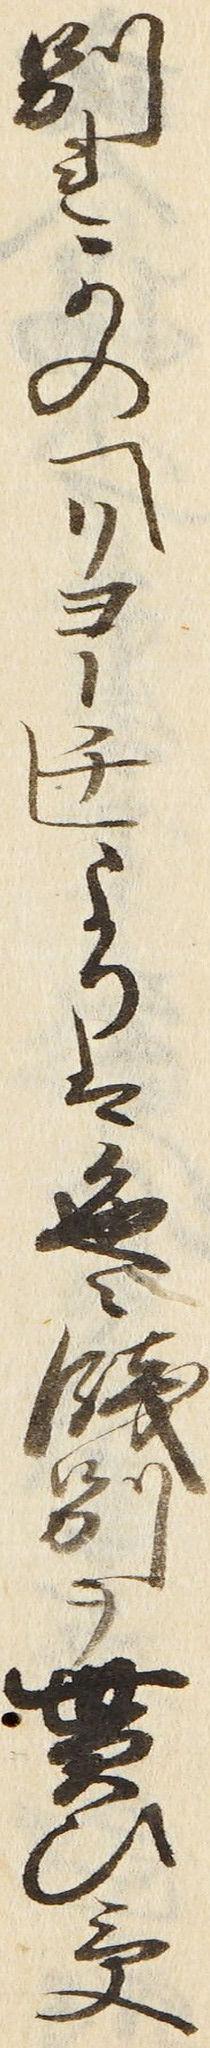別れかの「リヨーチ」よりは色々餞別ヲ貰ひ受
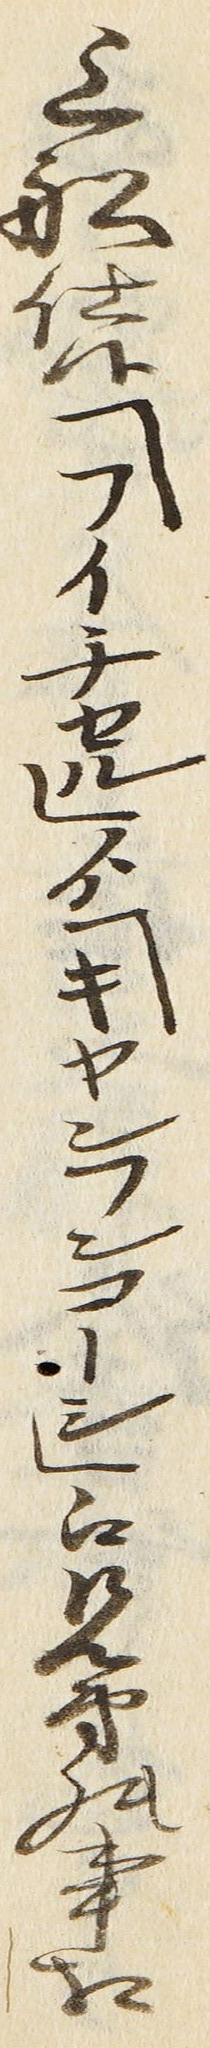上舩仕候「フイチセル」ゟ「キヤンフンコーシ」江兄弟の事相
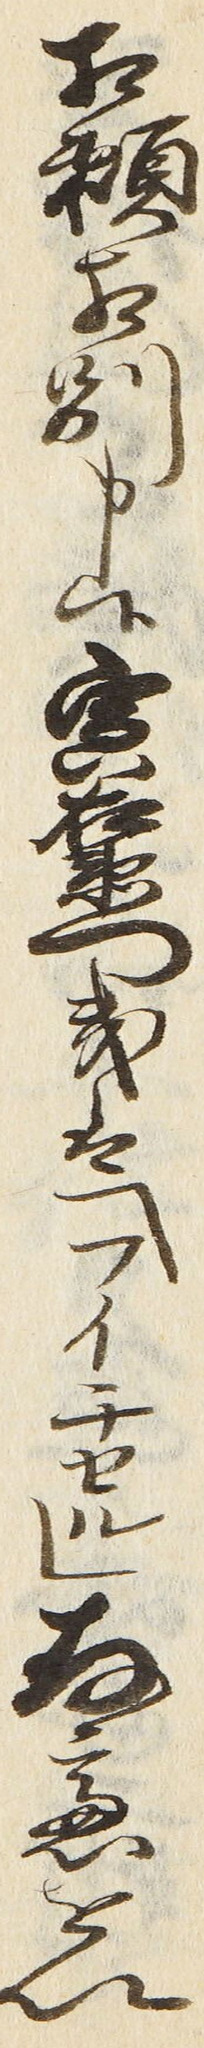相頼相別申候寅右衛門義は「フイチセル」存慮を以
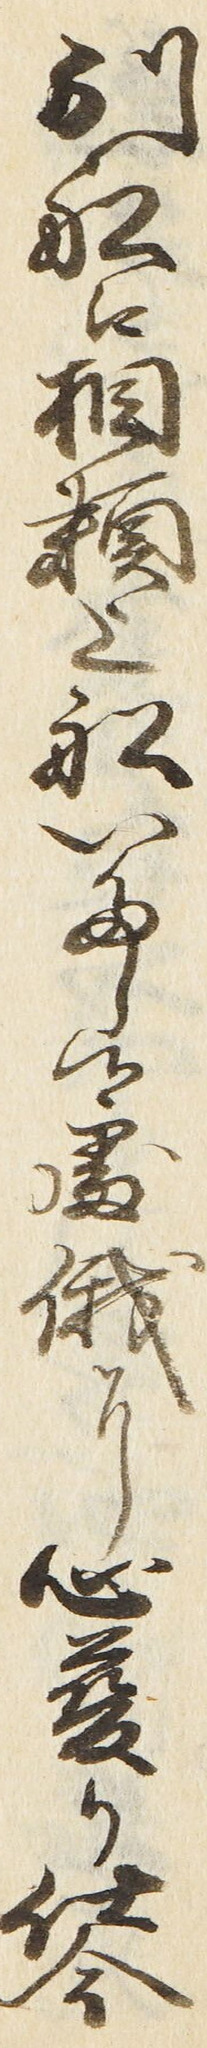別舩江相頼上舩いたし候處俄に心変り仕今
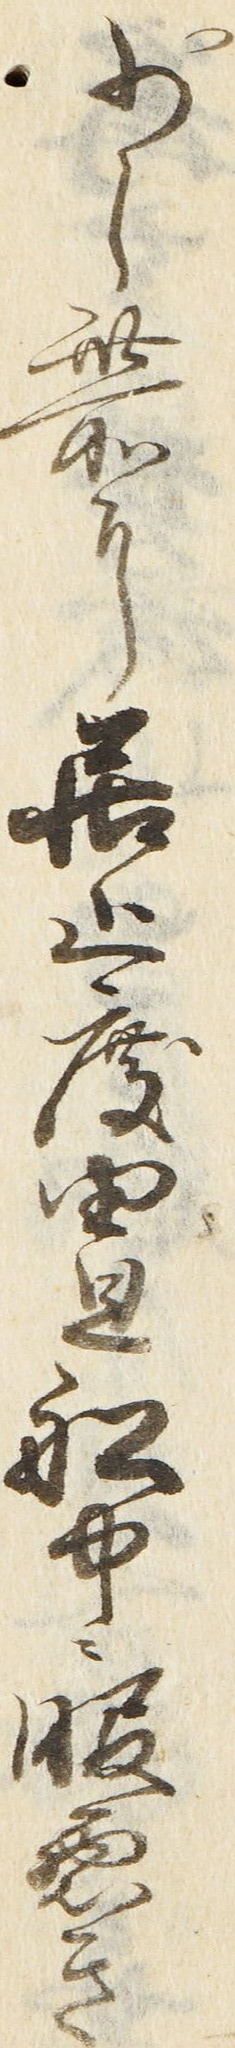少し此所に居止度由且舩中ニ腹悪き
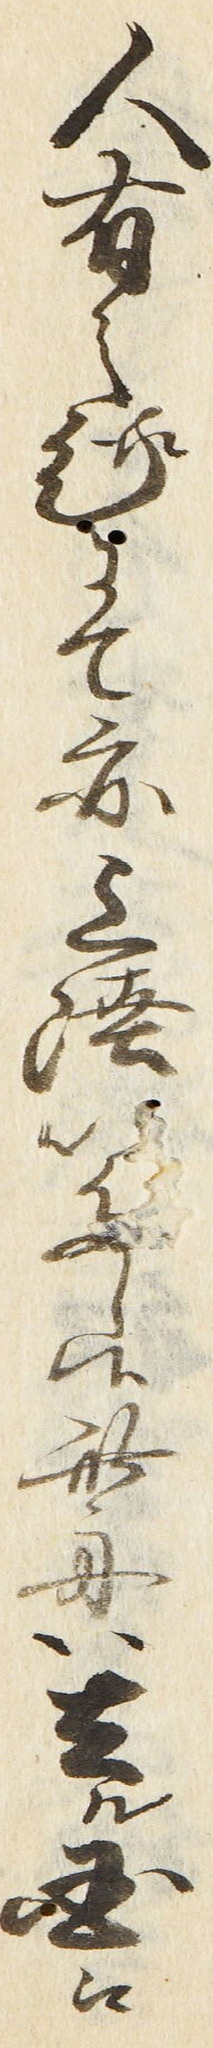人有之趣にて亦上陸いたし候此舟ハ去ル国江
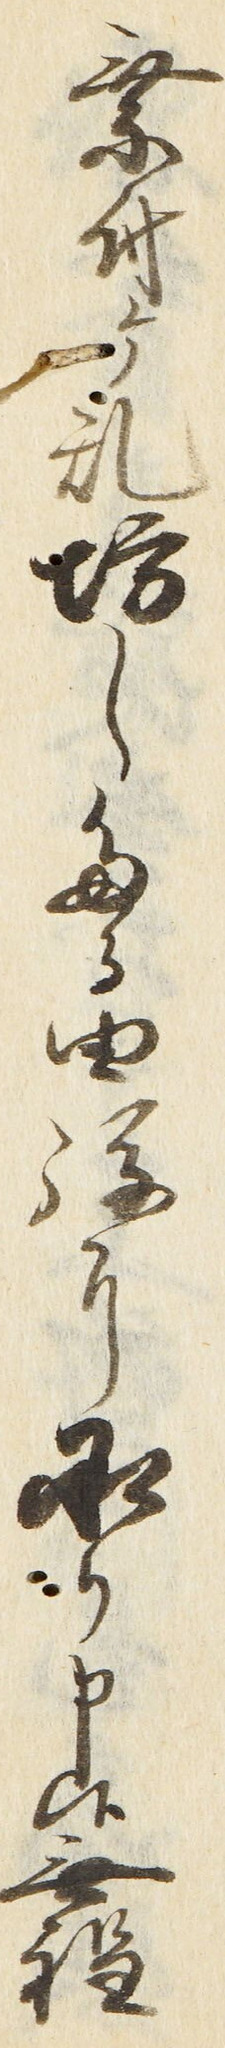乗付ケ乱坊したる由後に承り申候無程
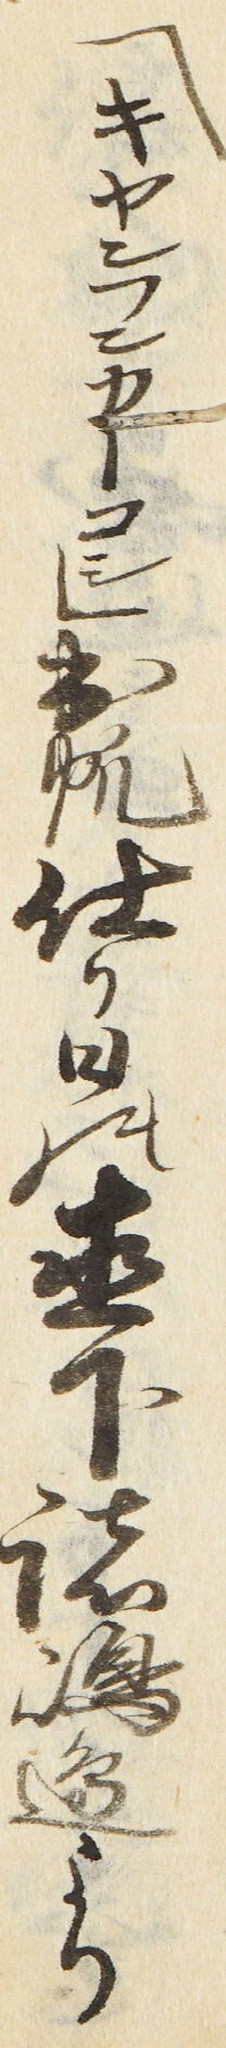「キヤンフンカーコシ」出帆仕り日の直下諸嶋邊より
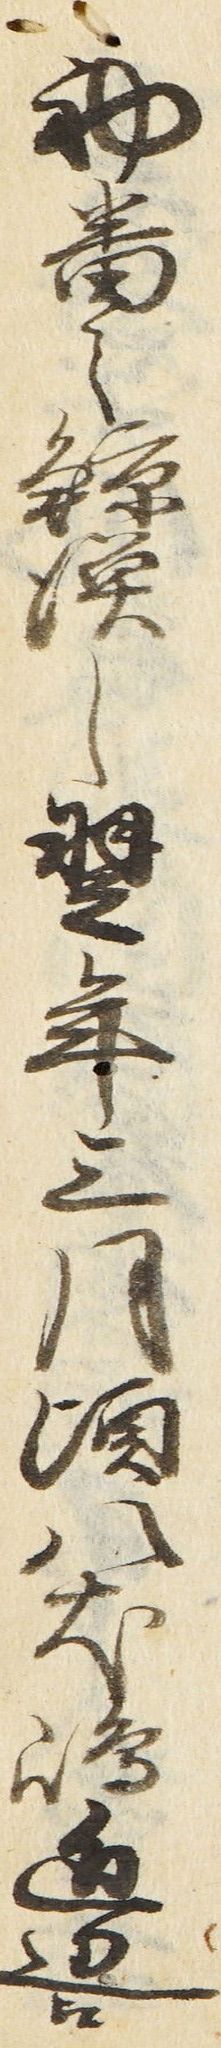初番之鯨漁し翌年三月頃八丈嶋近辺江

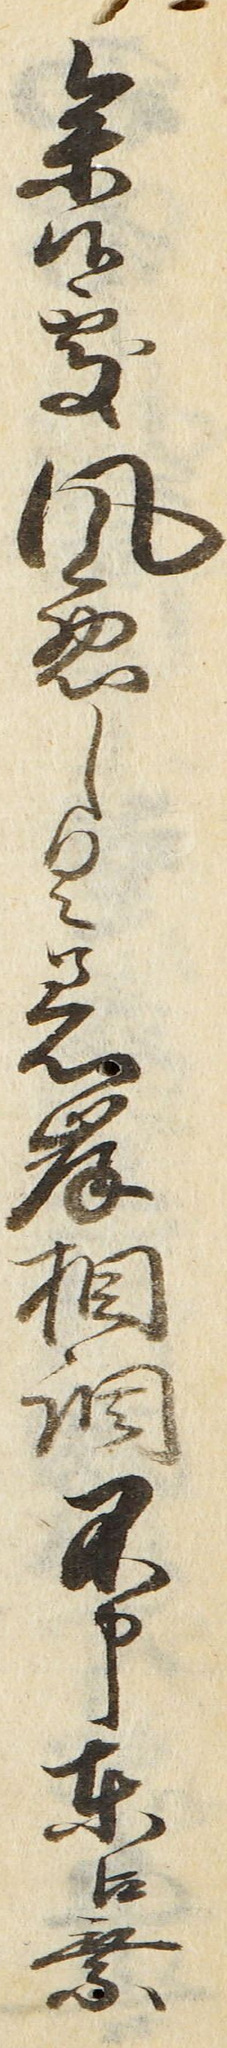参候處風悪しく着岸相調不申東江乗
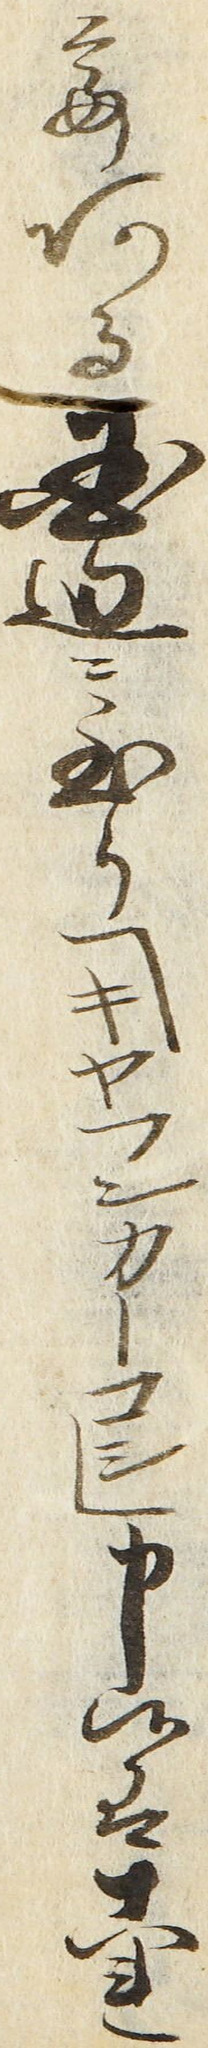てある国辺ニ至り「キヤフンカーコシ」申候はこれ
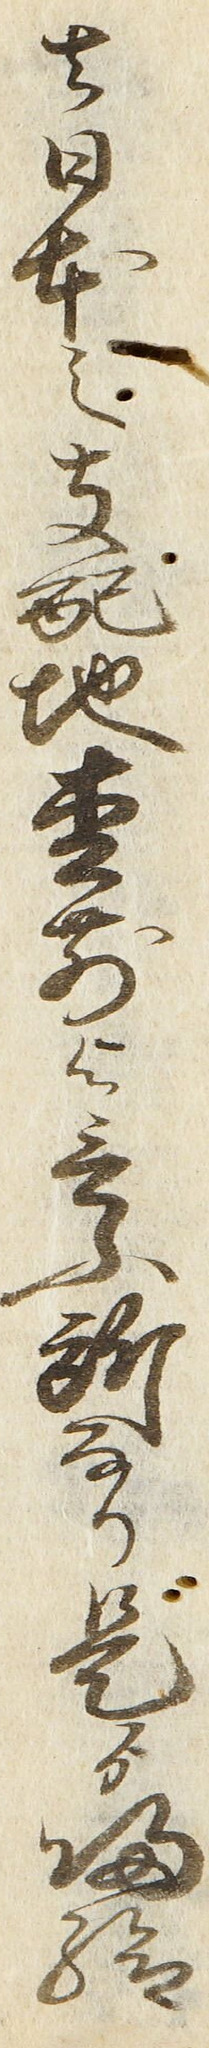者日本之支配地枩前と言ふ所なり是ゟ帰給
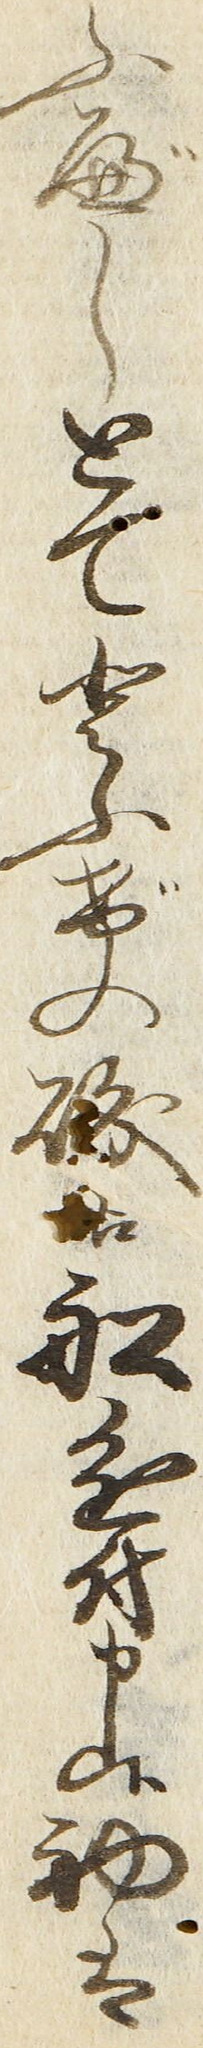ふべしとてとふげの磯江舩近付申候初は
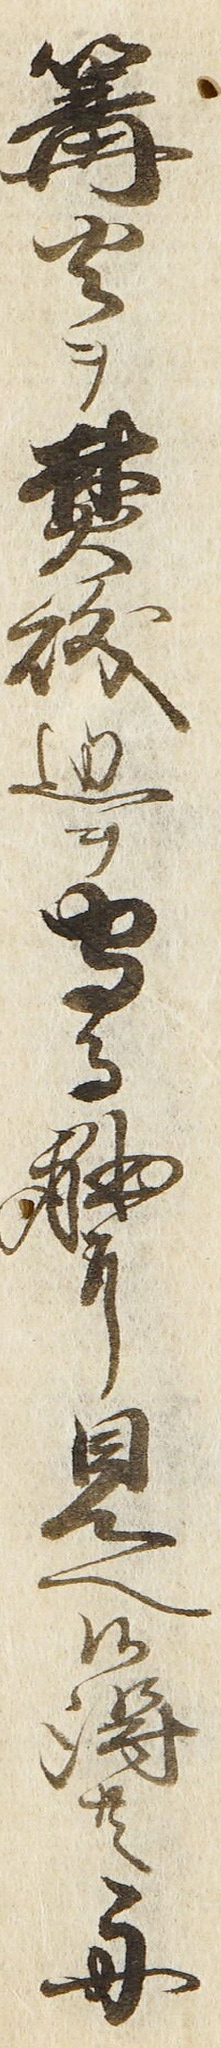篝火ヲ焚磯辺ヲ守る躰ニ見へ候得共舟
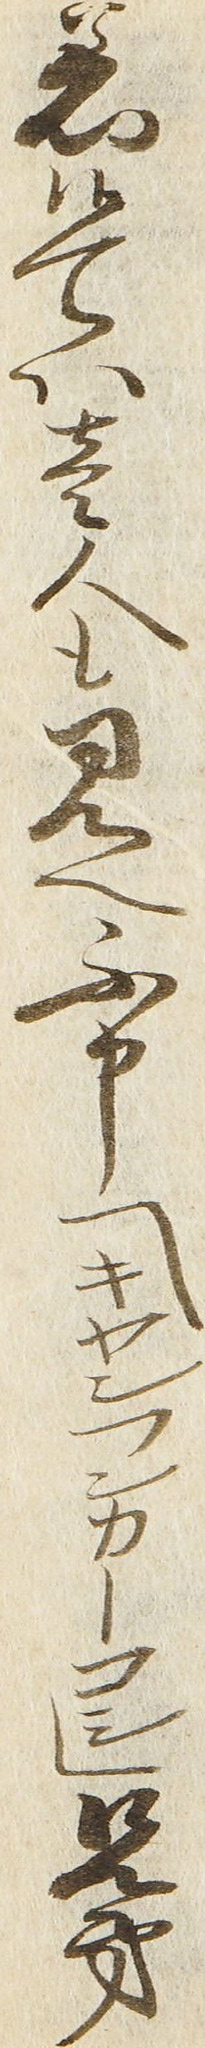着候てハ壱人も見へ不申「キヤフンカーコシ」兄弟
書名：漂客談寄
